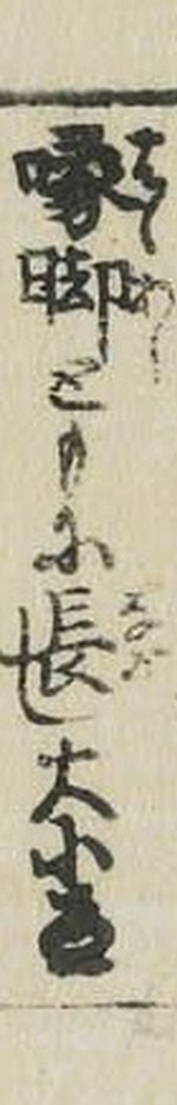喙脚ともに長し大小有
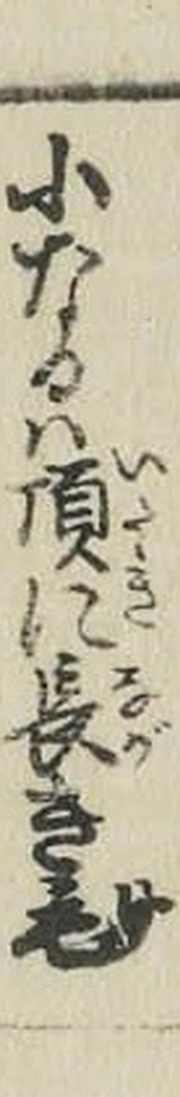小なるは頂に長き毛
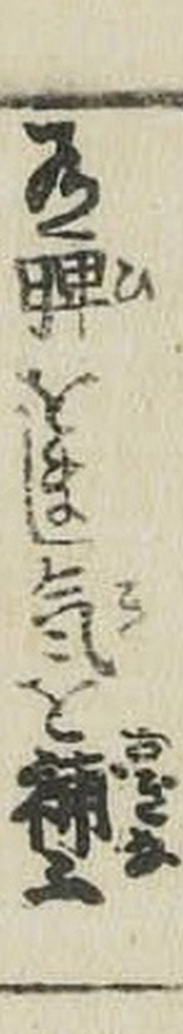有脾をまし気を補ふ
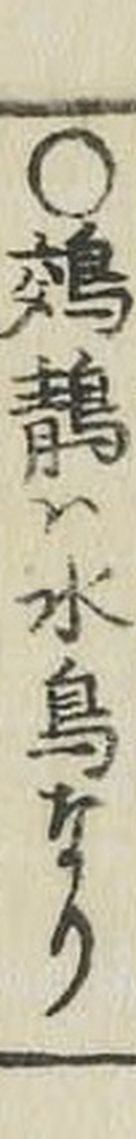○鵁鶄は水鳥なり
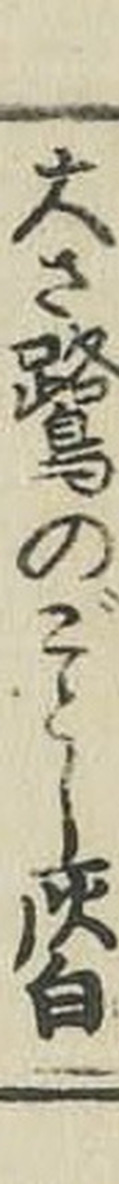大さ鷺のごとし灰白
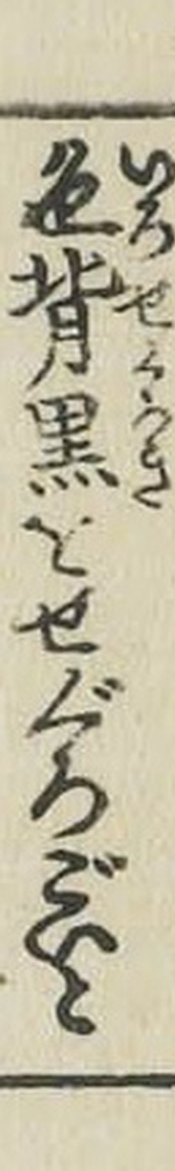色背黒をせぐろごいと
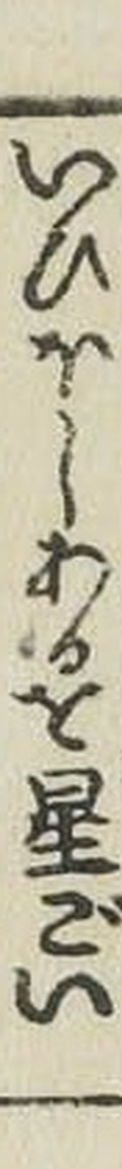いひほしあるを星ごい
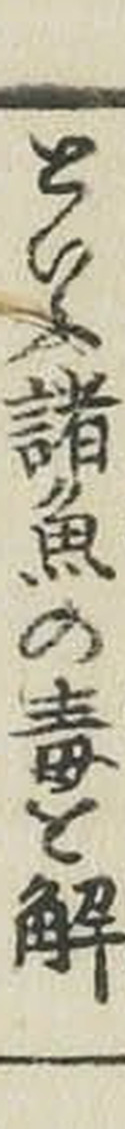といふ諸魚の毒を解
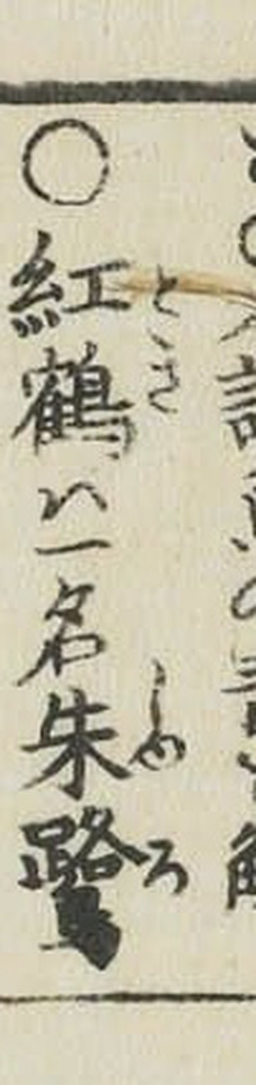○紅鶴は一名朱鷺
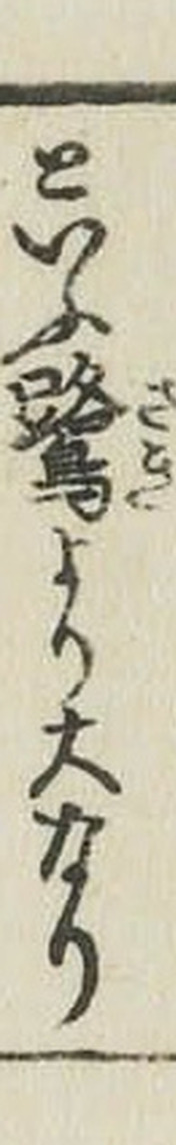といふ鷺より大なり
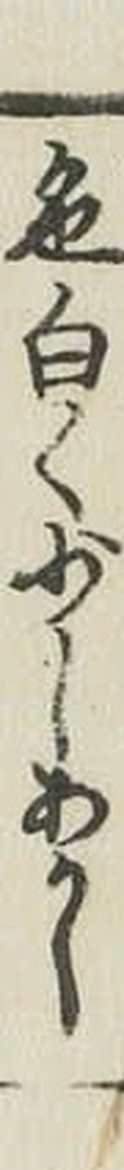色白く少しあかし
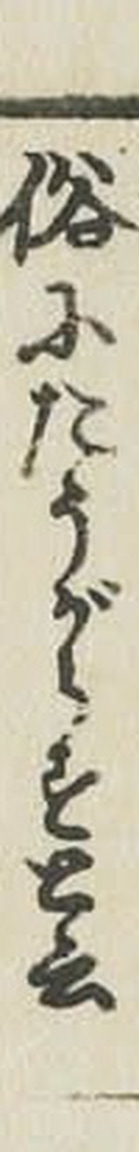俗にたうがらすと云
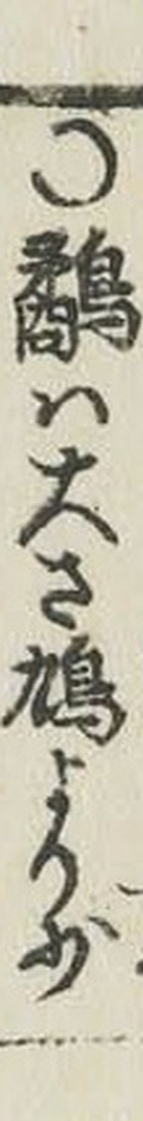○鷸は大さ鳩より少
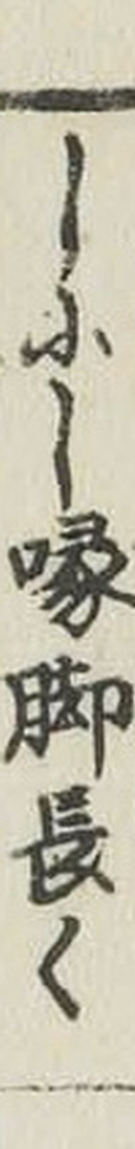し小し喙脚長く
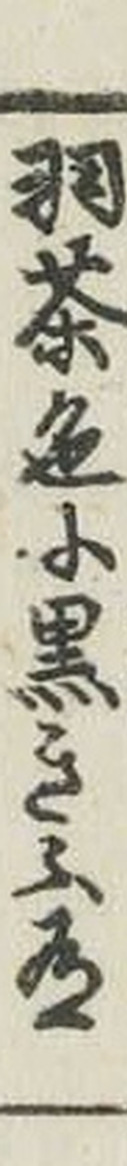羽茶色に黒きふ有
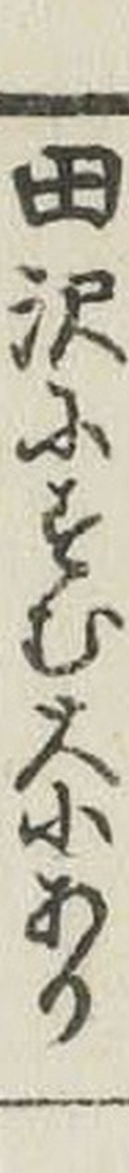田沢にすむ大小あり
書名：増補頭書訓蒙図彙大成 10巻 6:巻之12-13
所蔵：東京学芸大学教育コンテンツアーカイブ
